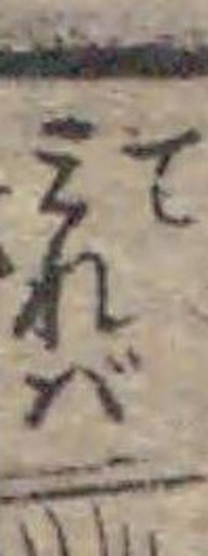みれば
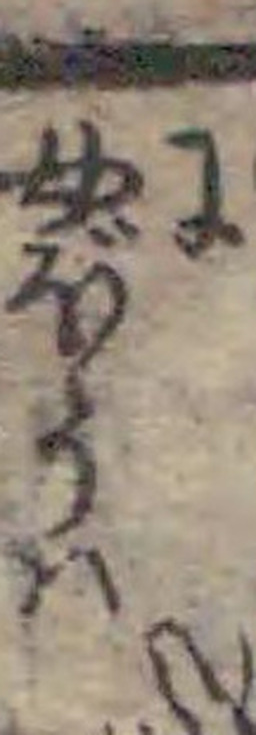女ぼうは
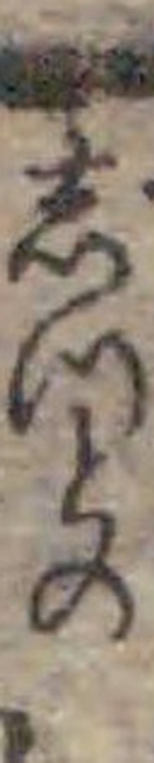しつとの
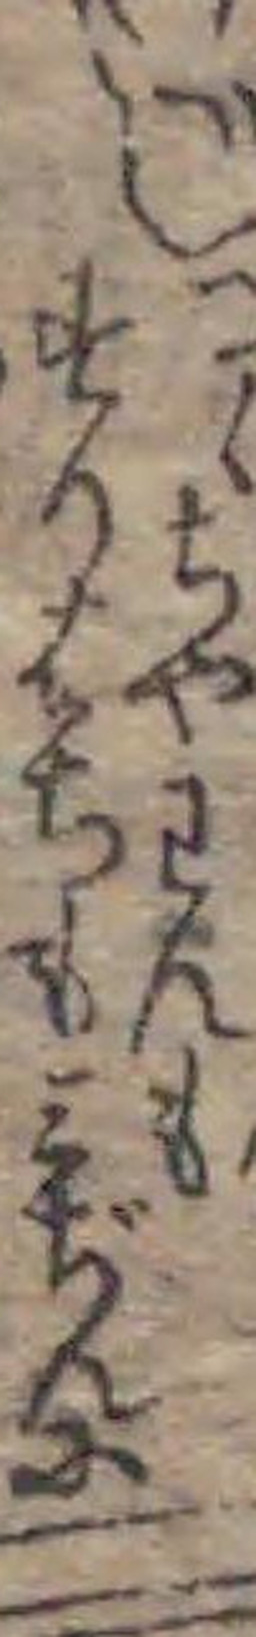すりはちもみぢんに
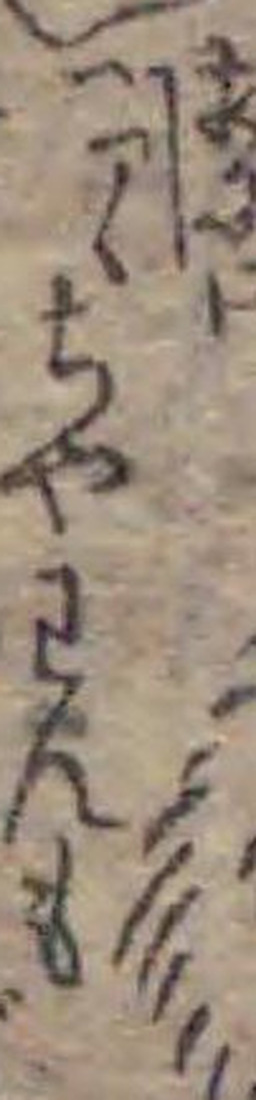〽アヽちやわんも
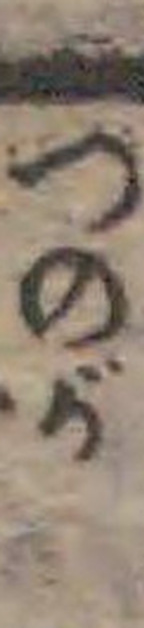つのが
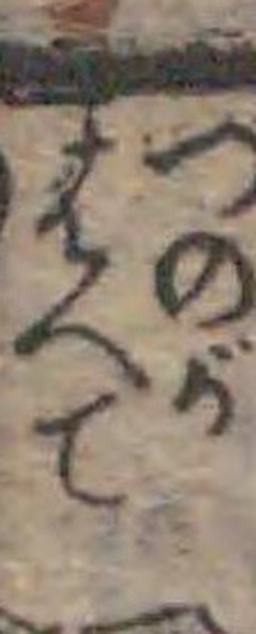はへて
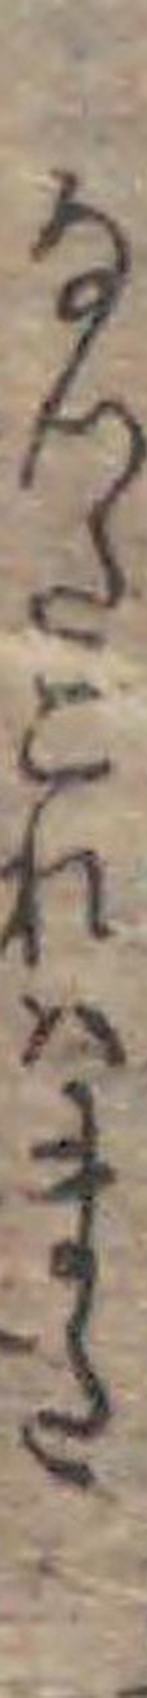なつたこれはまた
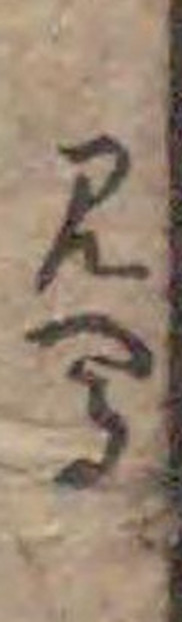見へる
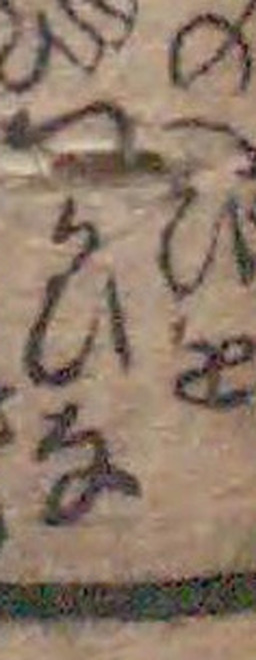つかひな
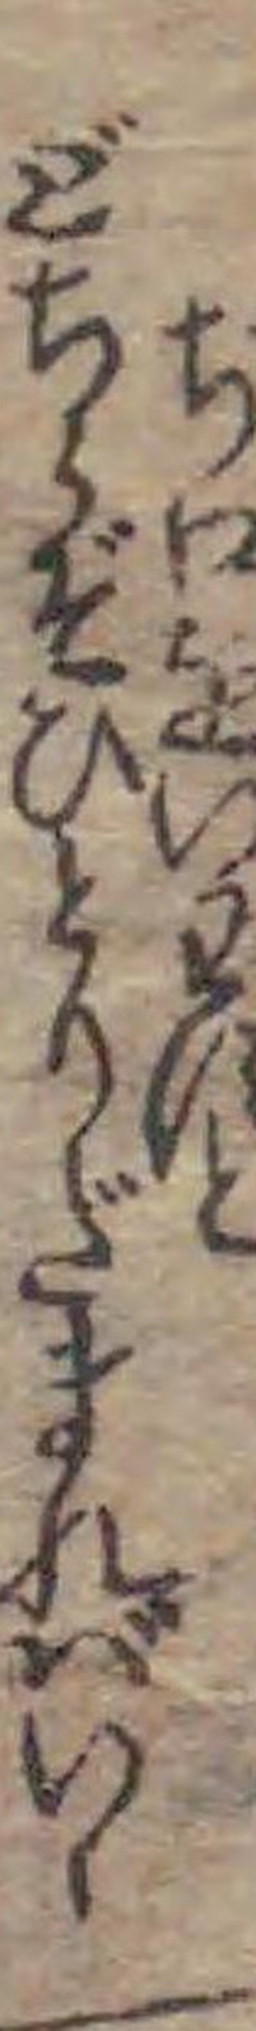どちらぞひとりだまればいゝ
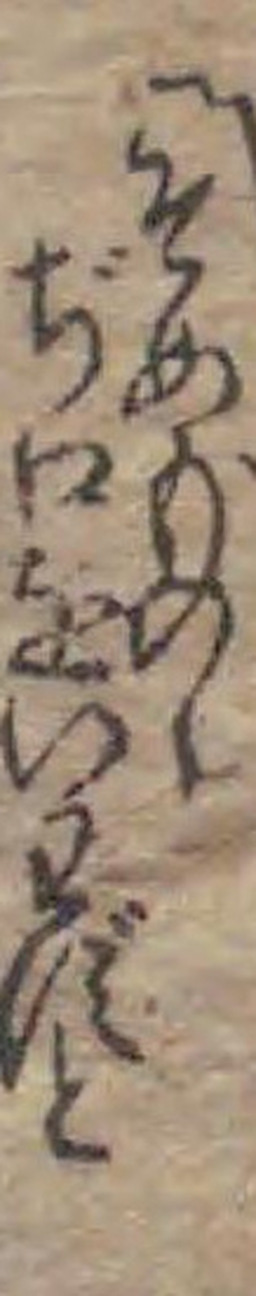ぢ口をいわずと
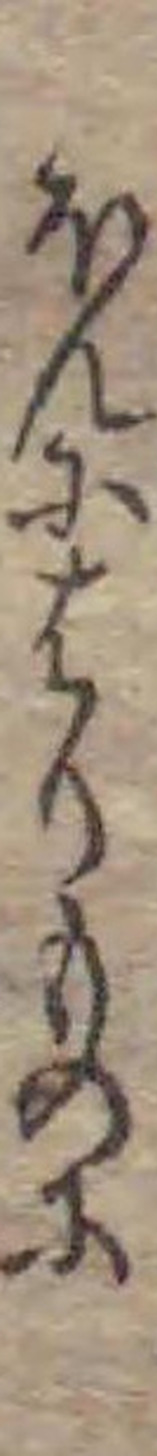ほんにはりものに
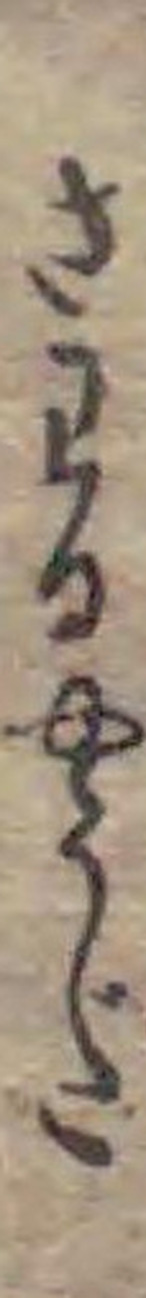さわるやうだ
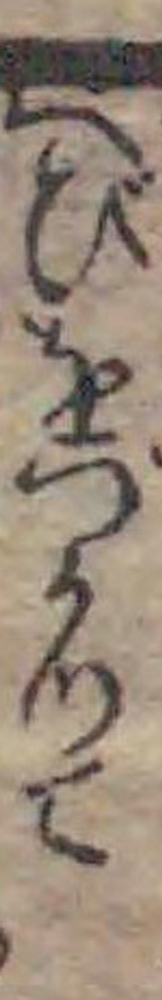へびをつかつて
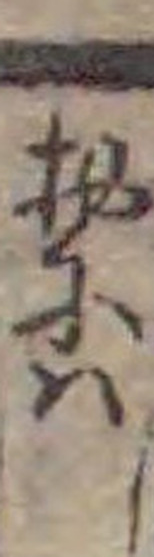おには
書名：怪物つれつれ草 : 2巻
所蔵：国立国会図書館 National Diet Library, JAPAN
